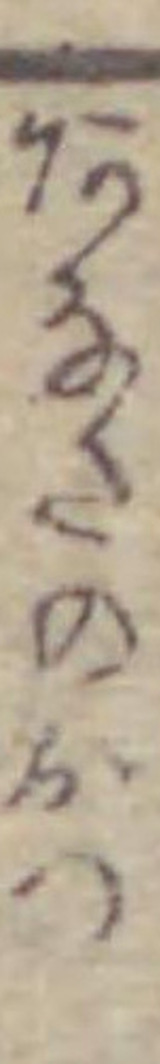あなたのおつ
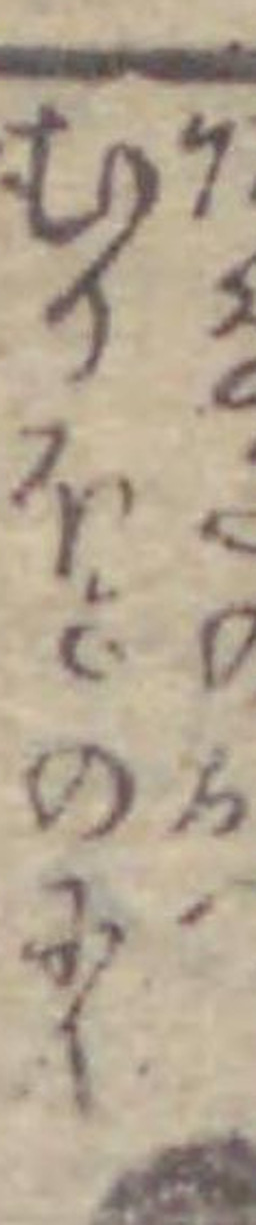むりほどのにん
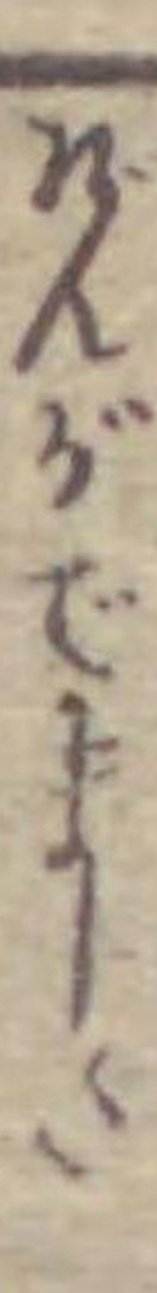げんがでました
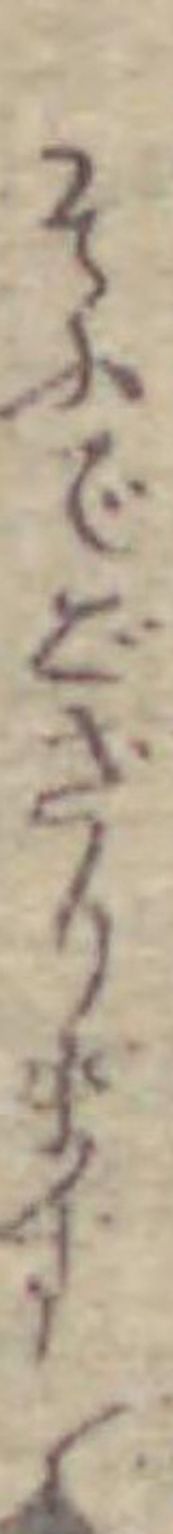そふでござります
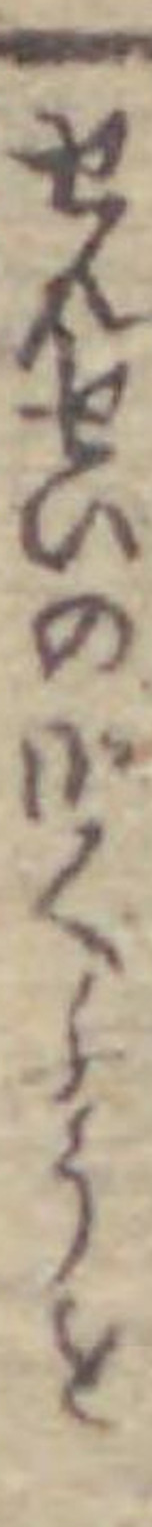せんせいの御くふうを
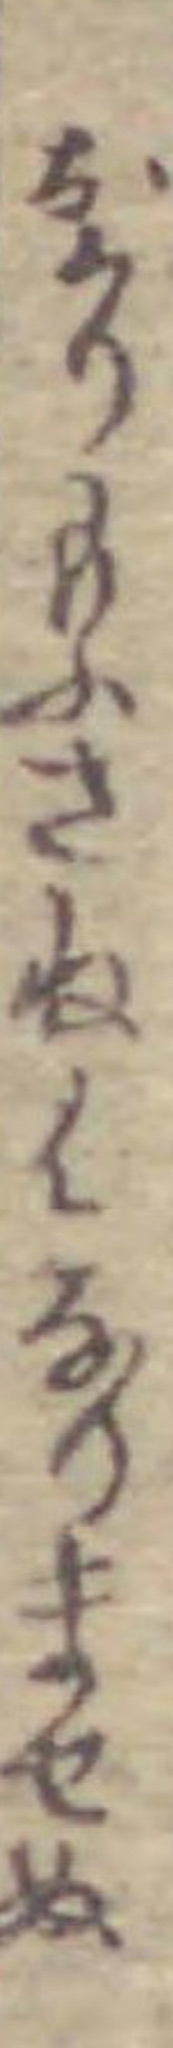おかりもふさねはなりませぬ
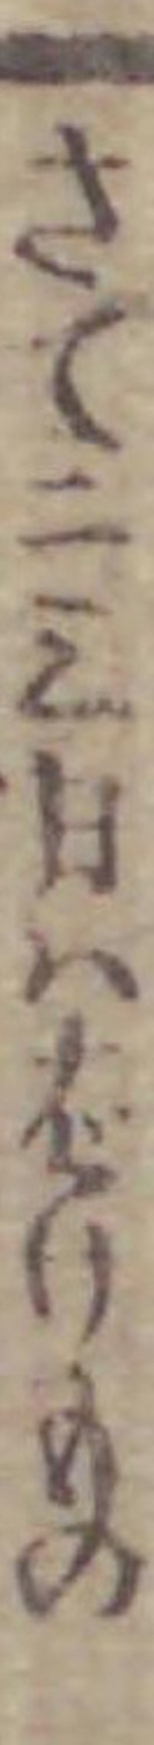さて二三日はばけもの
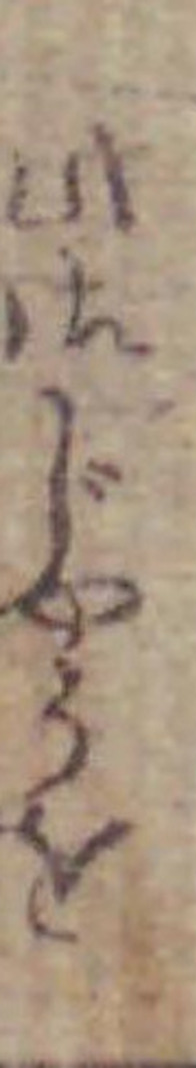此御じやうを
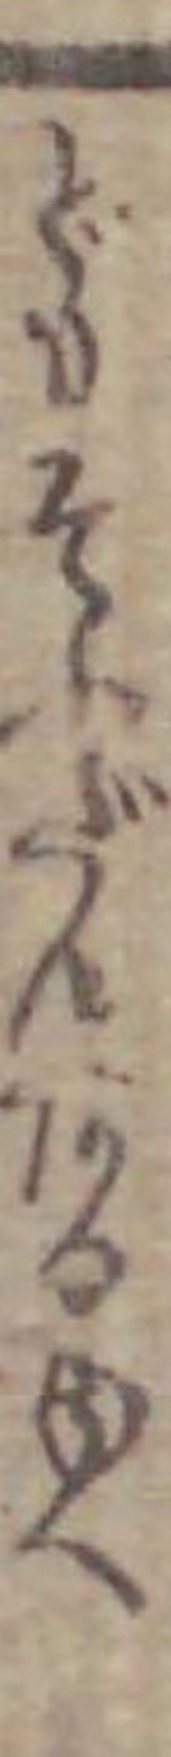どもそふだんあるゆへ
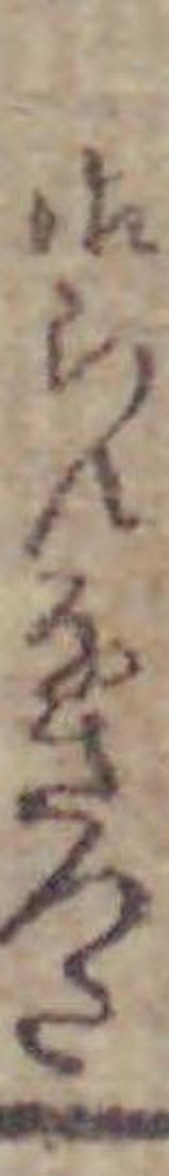御らんなさつた
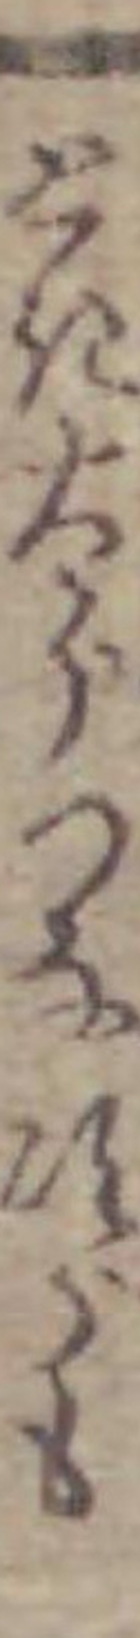とき太郎つな次郎も
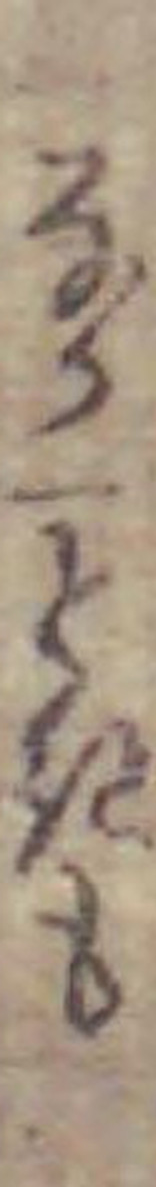なら一ときも
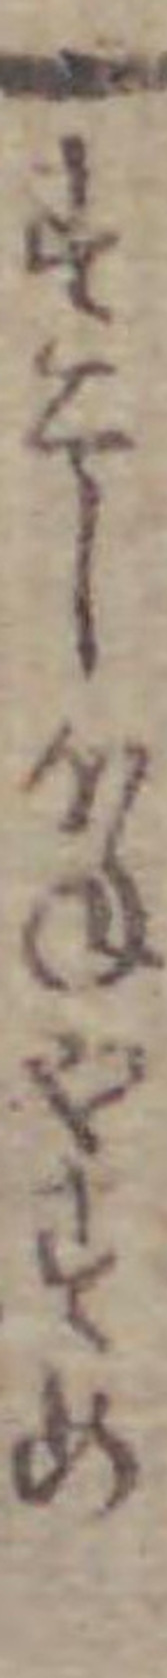すこしほねやすめ
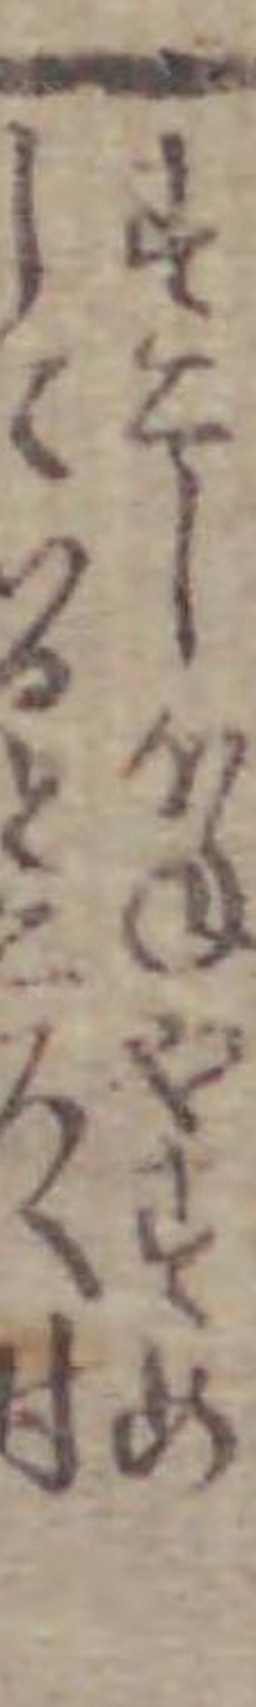しているところへ時
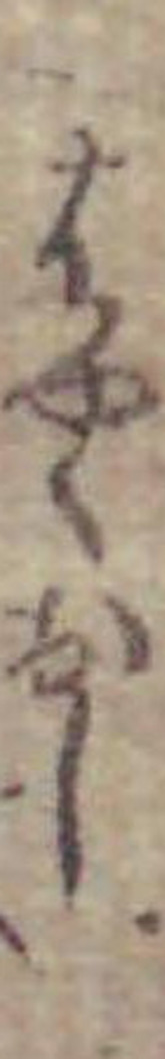はやくおし
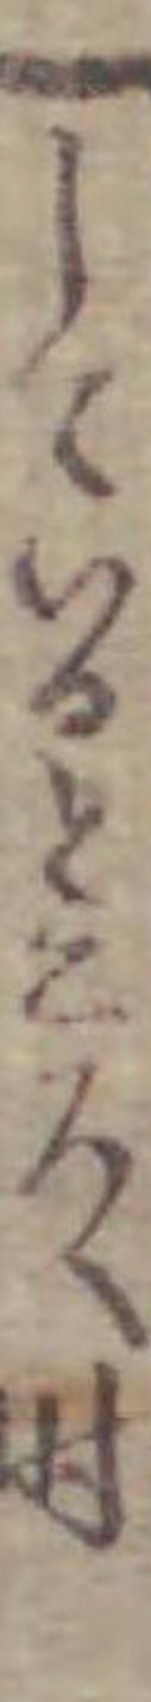しているところへ時
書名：二日替 : 2巻
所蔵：国立国会図書館 National Diet Library, JAPAN
